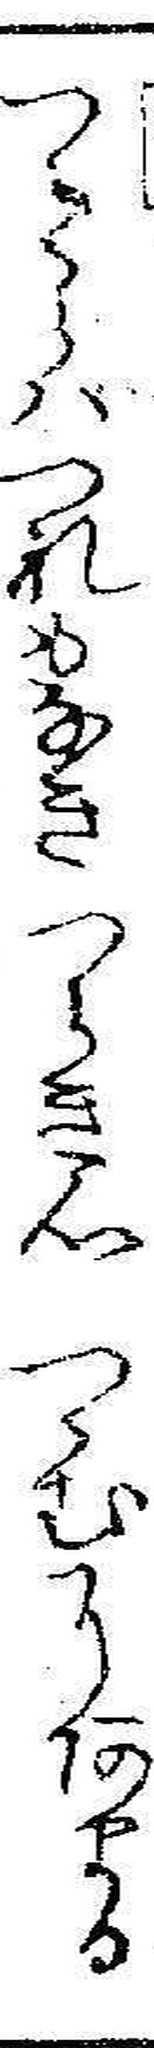つらばつれもなきつらき心つゝむにあまる
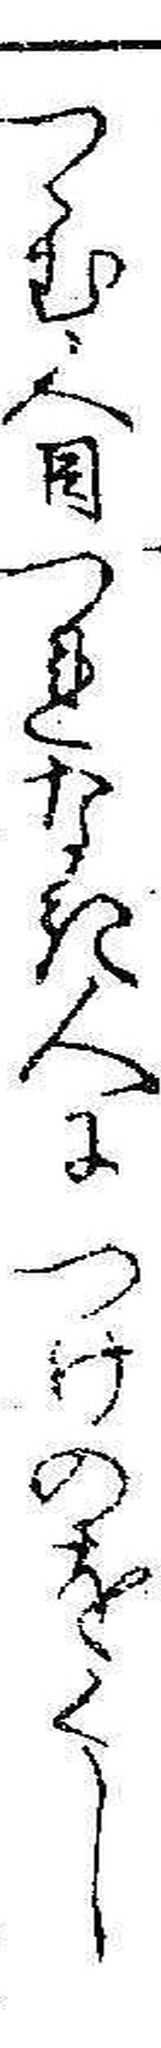つゝむ人目つれなき人につけのをくし
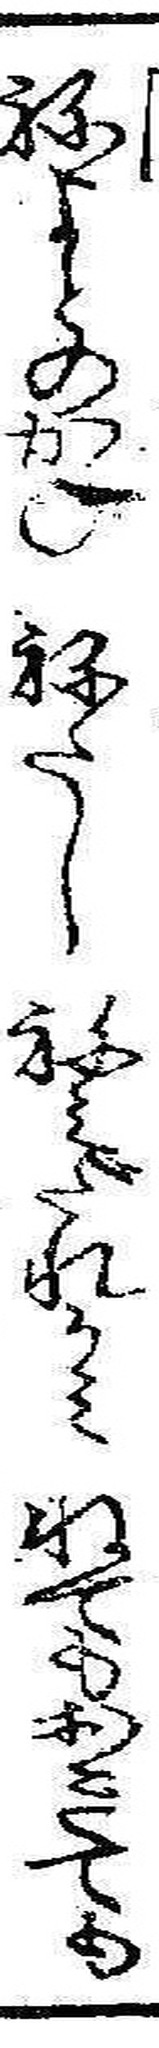ねねもやらすねぬなはねみだれかみねてもおきても
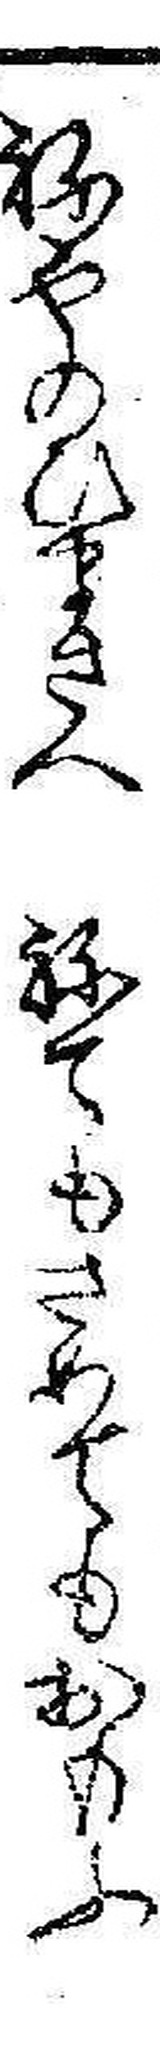ねやのひまさへねてもさめてもおもふ
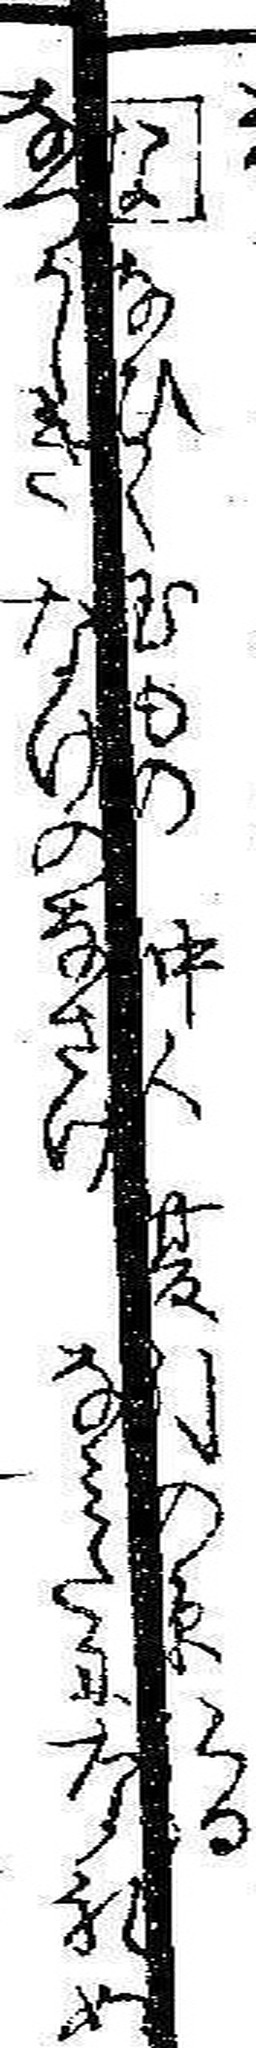なつかしきなけのなさけなみたになぬ
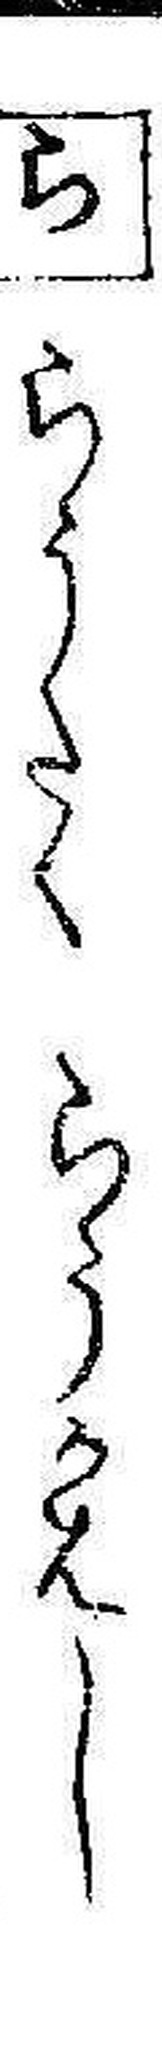ららうたくらうし
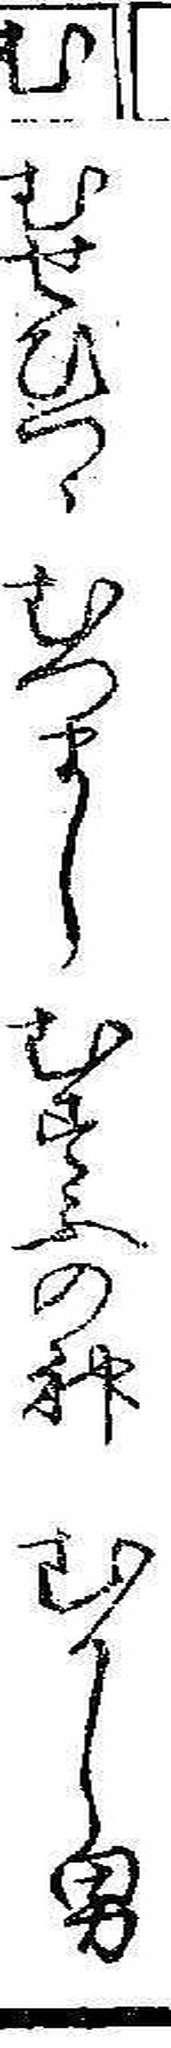むむせひつゝむつましむすふの神むかし男
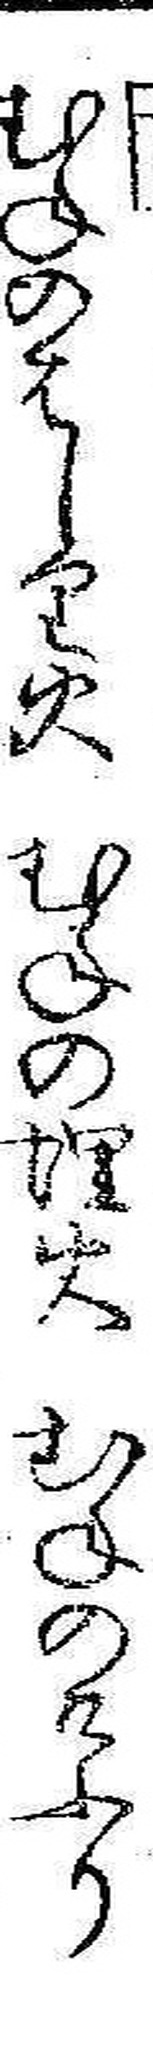むねのはしり火むねの埋火むねのけふり
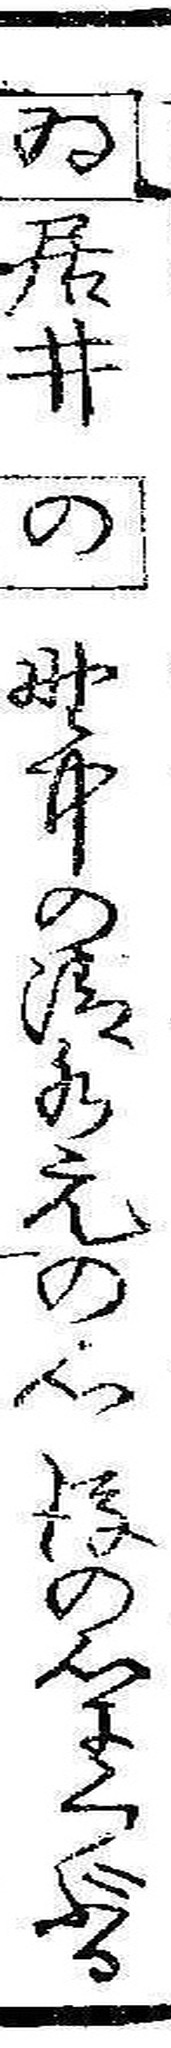ゐ居井の野中の清水元の心後の心にくらぶる
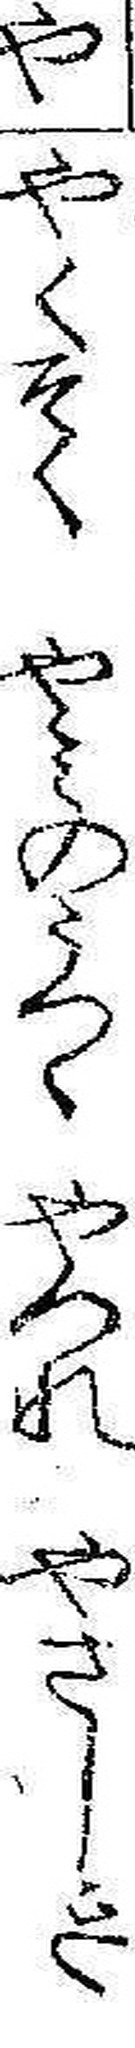ややくそくやみのつゝやつれやさしき
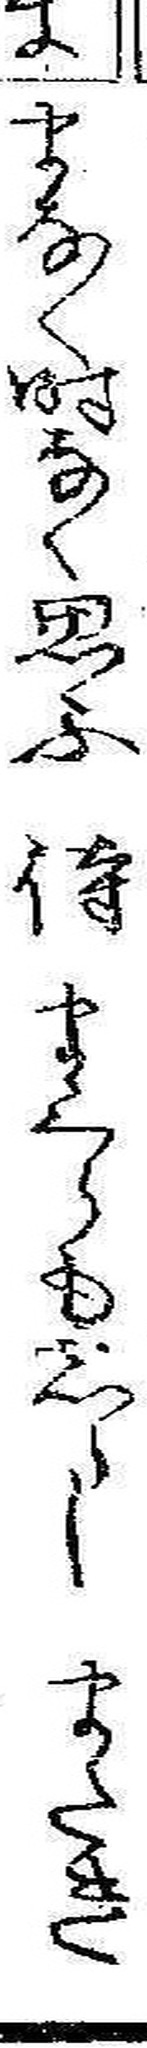ままなく時なく思ふ待まくらもしたしまたき
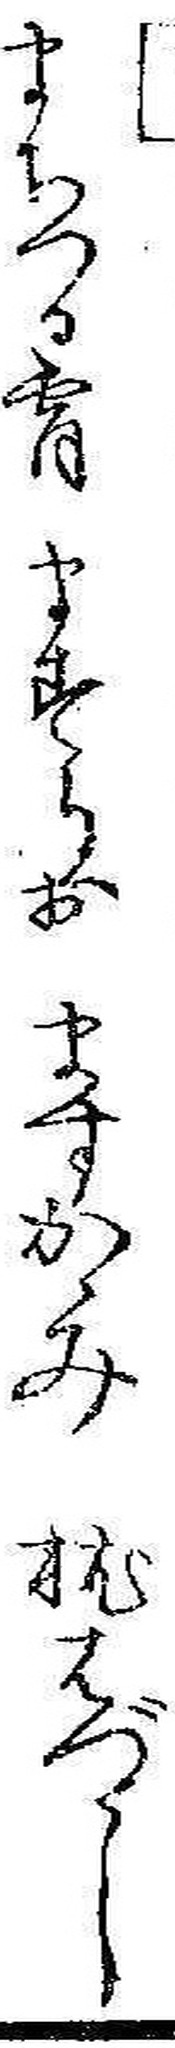まちつる宵ますらおますかゝみ枕はづし
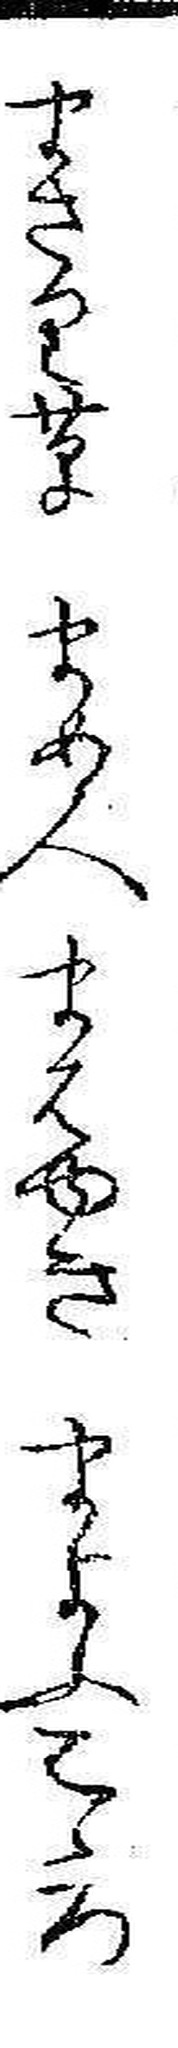まさる草まめ人まはゆきまよふこゝろ
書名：狂哥はまのきさご
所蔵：国文学研究資料館
